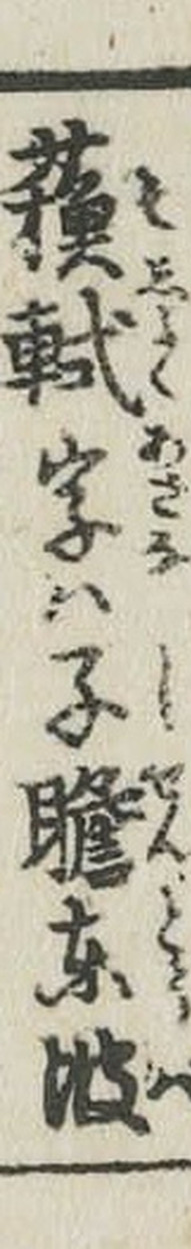蘇軾字は子瞻東坡
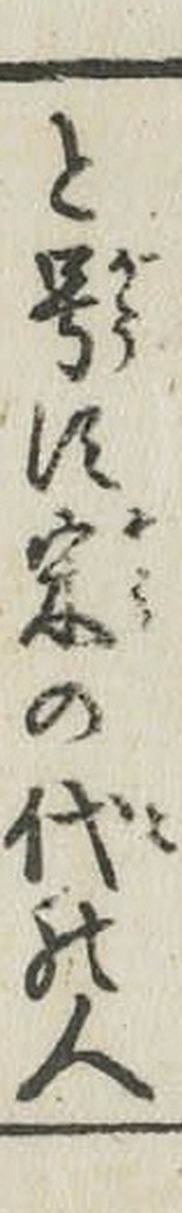と号す宋の代の人
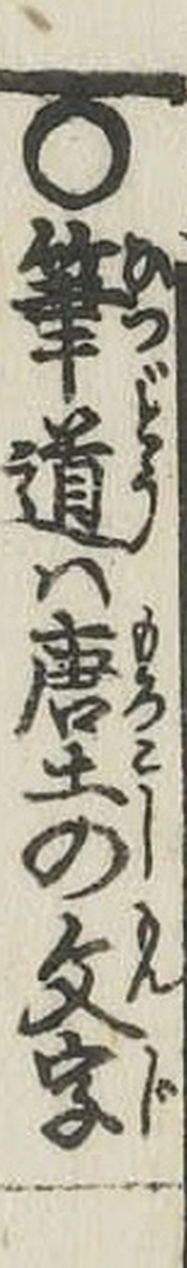○筆道は唐土の文字
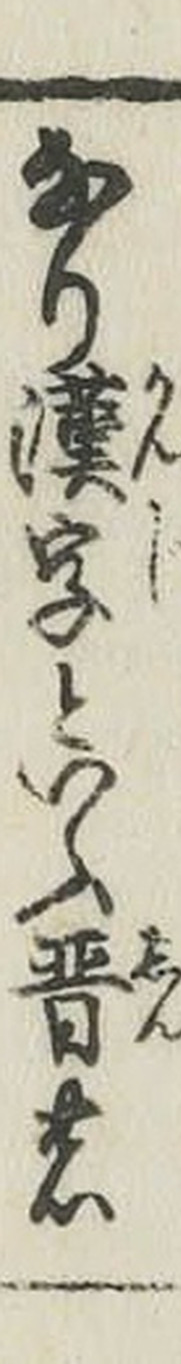なり漢字といふ晋の
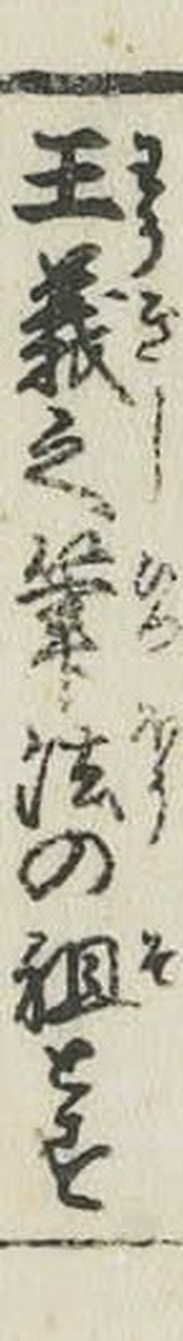王義之筆法の祖とす
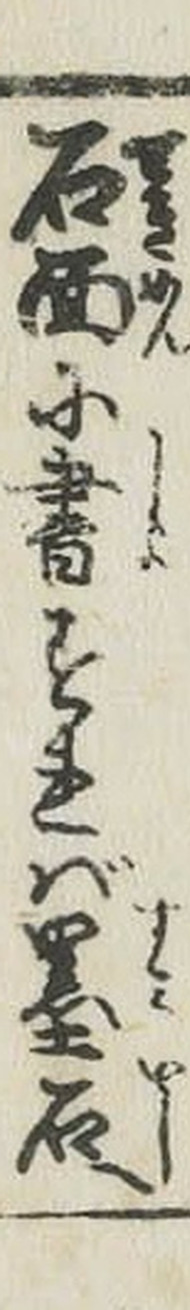石面に書すれば墨石
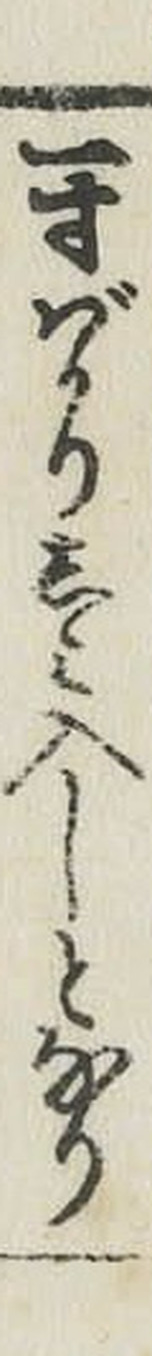一寸ばかりしみ入しとなり
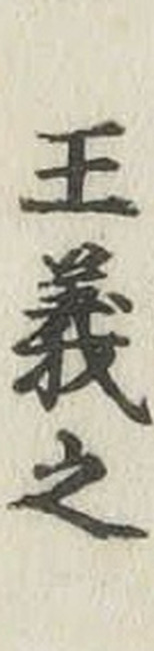王義之
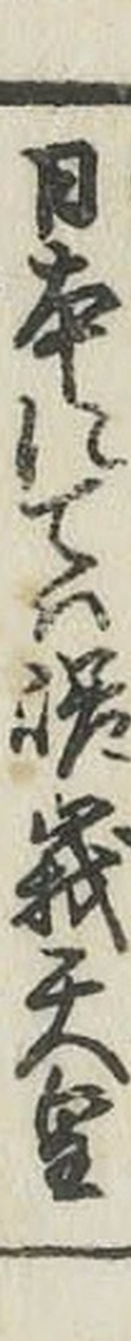日本にては嵯峨天皇
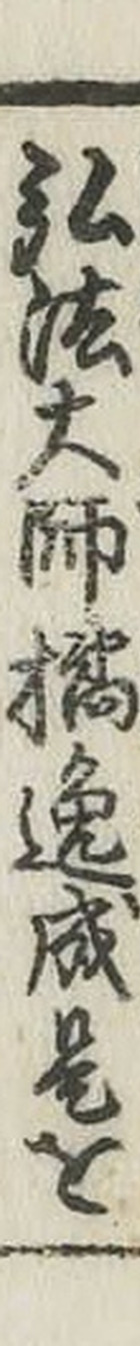弘法大師橘逸成是を
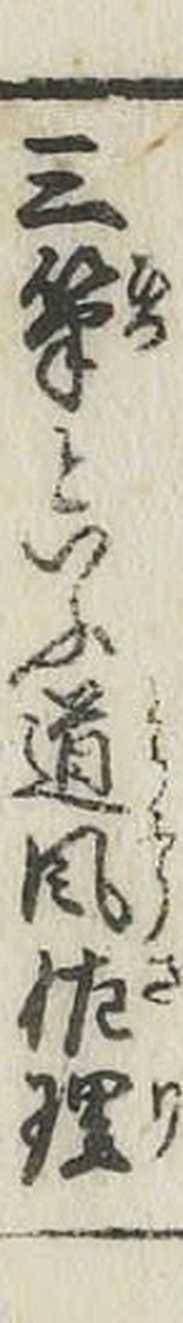三筆といふ道風佐理
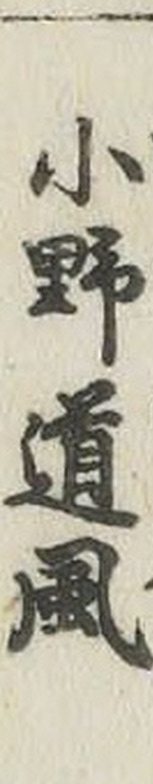小野道風
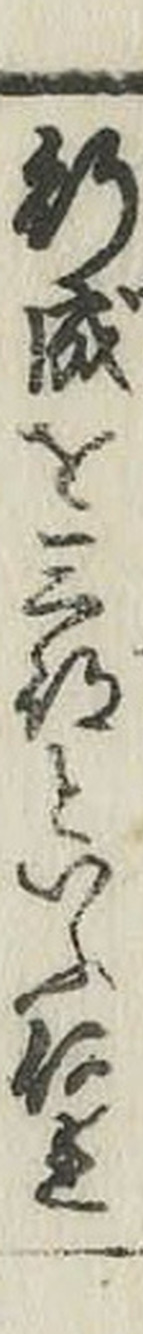行成を三蹟といふ何れ
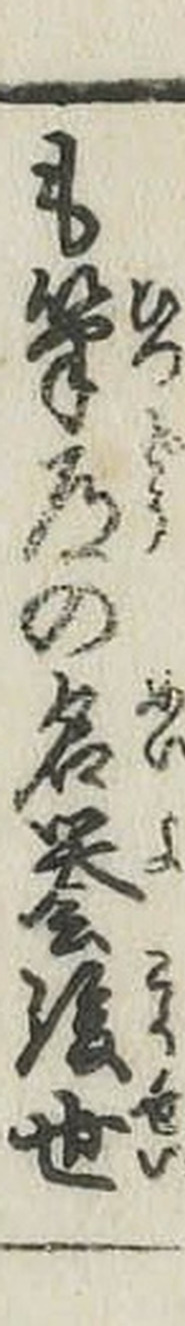も筆道の名誉後世
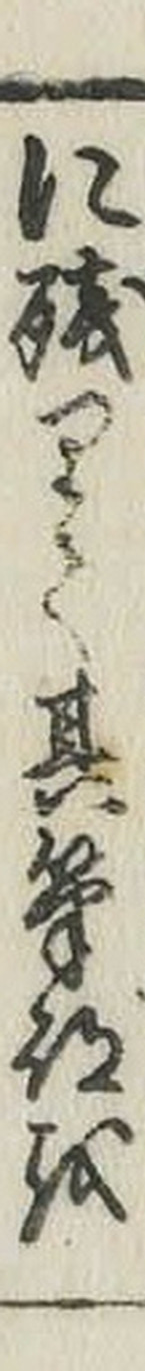に残りて其筆跡を
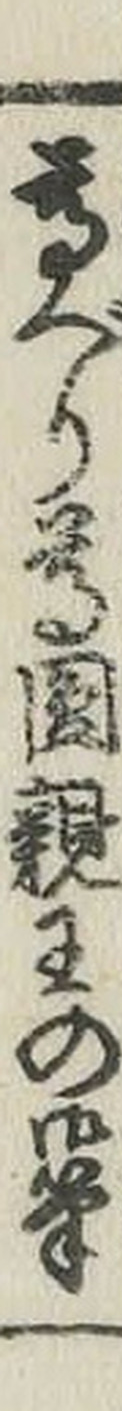尊べり尊円親王の御筆
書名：増補頭書訓蒙図彙大成 10巻 10:巻之21
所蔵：東京学芸大学教育コンテンツアーカイブ
